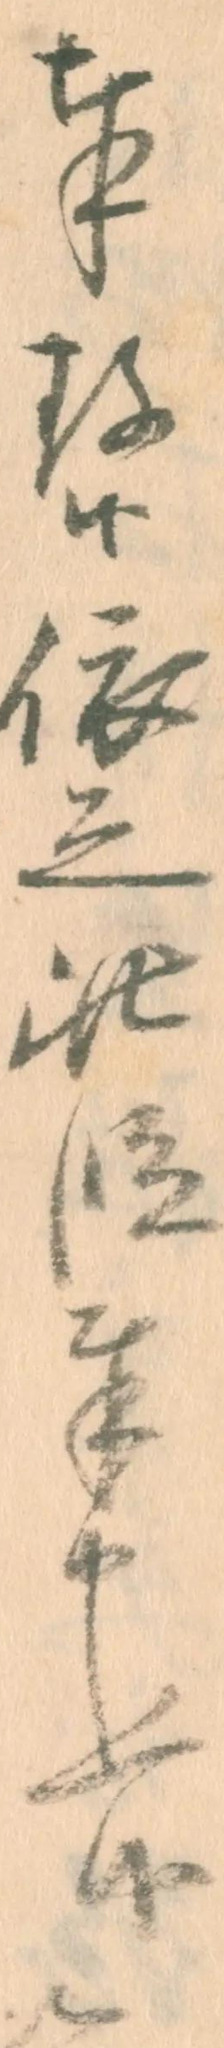奉存候依之此段奉申上候
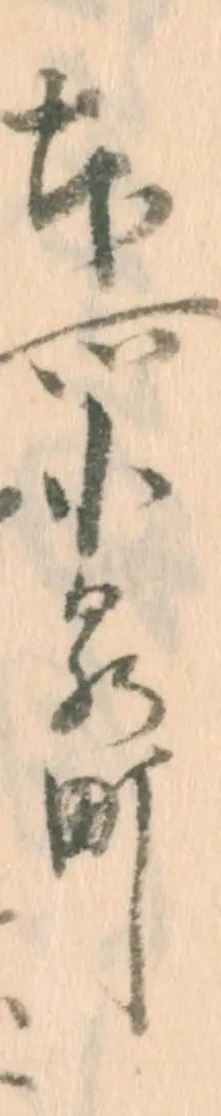本所小泉町
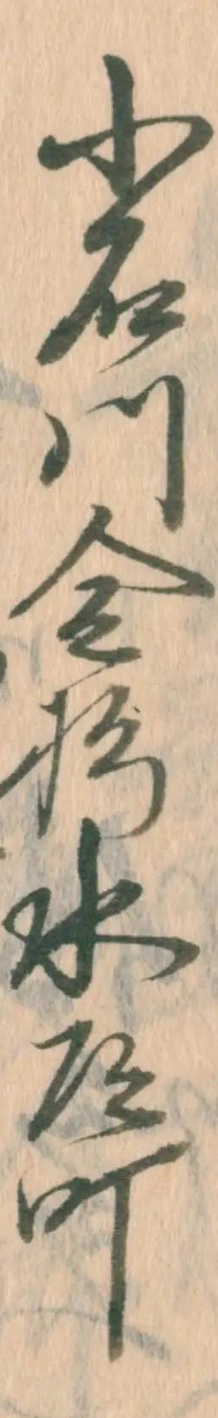小石川金杉水道町
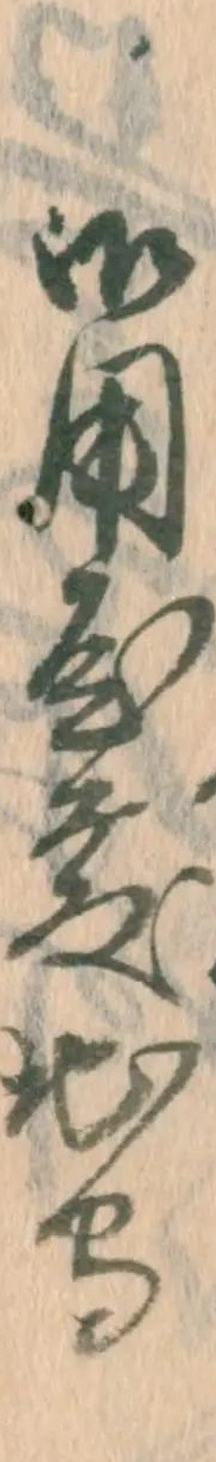御用屋敷地守
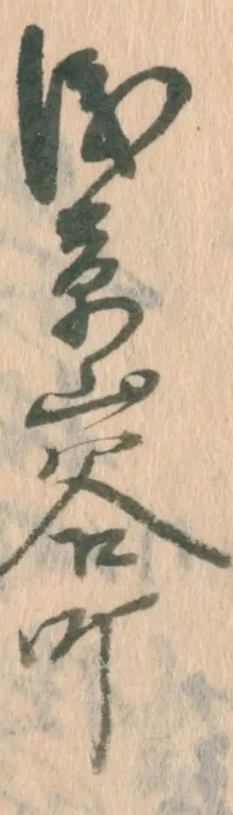浅草山谷町
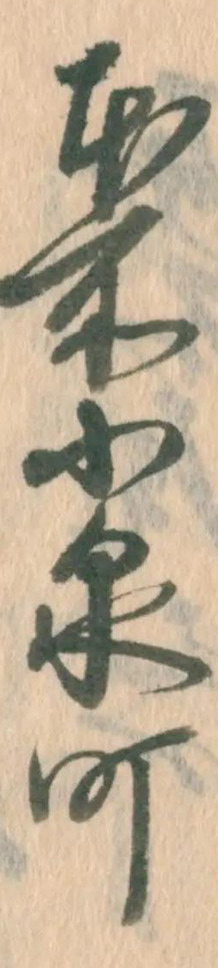本所小泉町

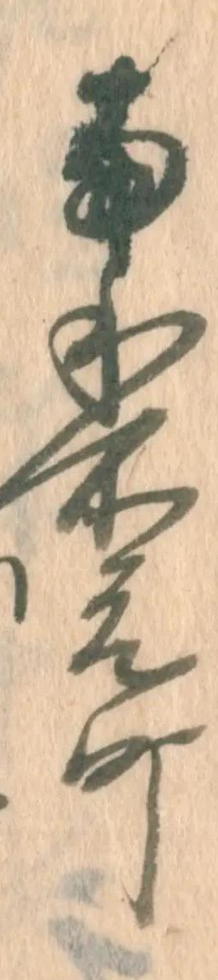南本所元町
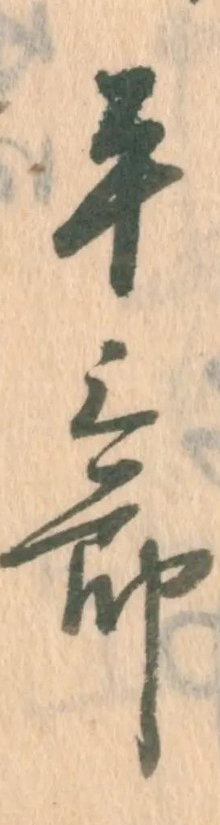平三郎
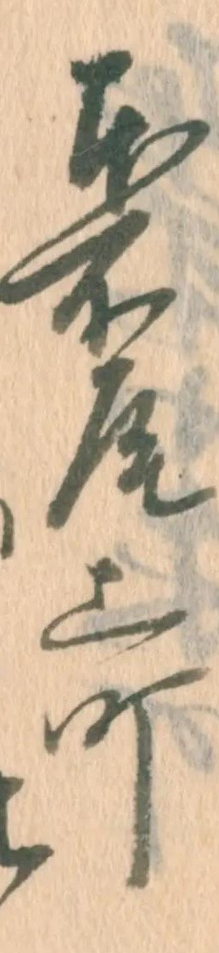本所尾上町
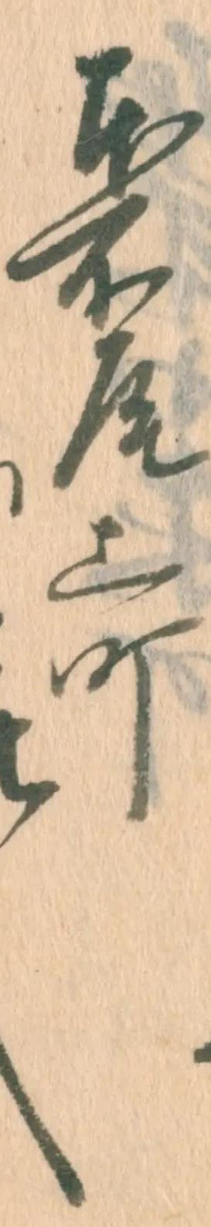本所尾上町
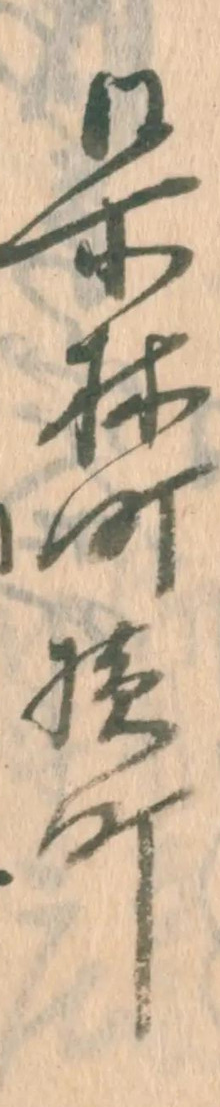同所林町横町
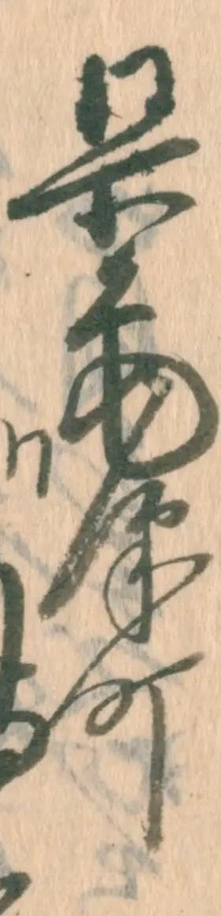同所亀沢町
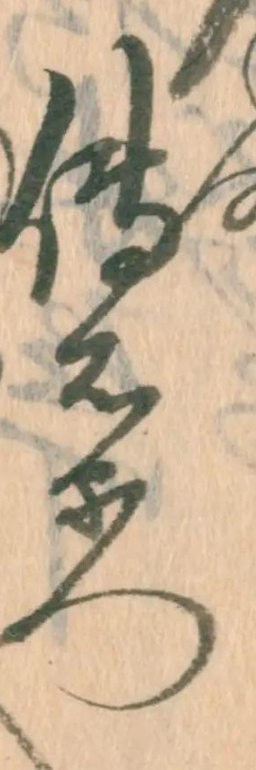伝右衛門
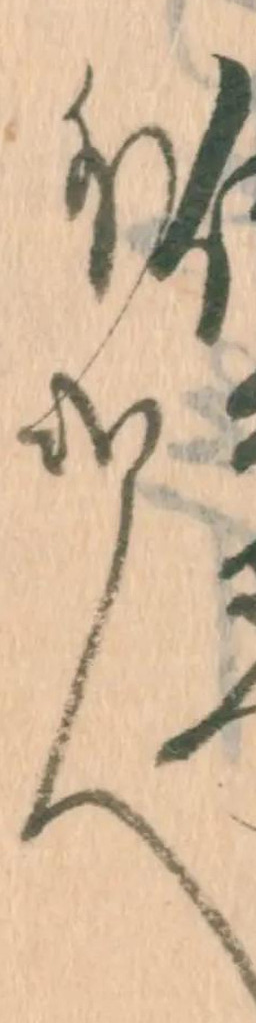外弐人
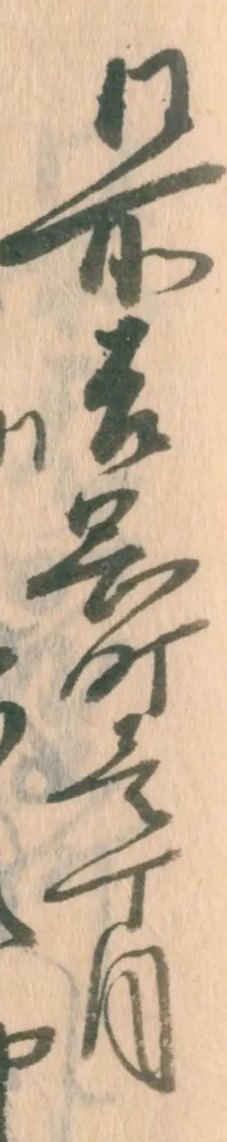同所吉岡町壱丁目
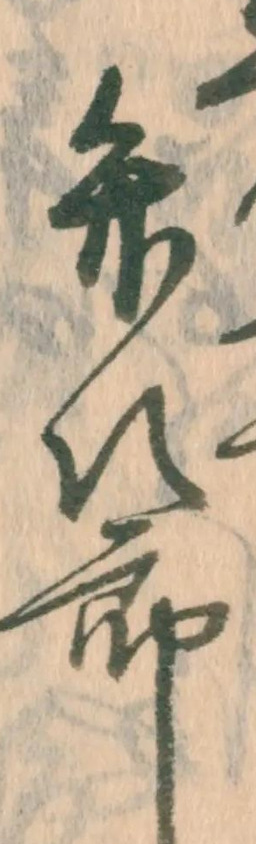弁次郎
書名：地震災書留 2巻. [1] 内表紙に「地震災書留　安政二卯年　但本所深川御用屋敷地代免除調」とあり
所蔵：国立国会図書館 National Diet Library, JAPAN
